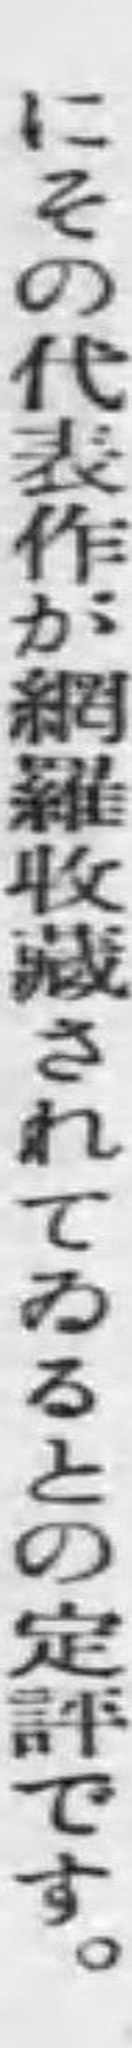にその代表作が網羅収蔵されてゐるとの定評です。
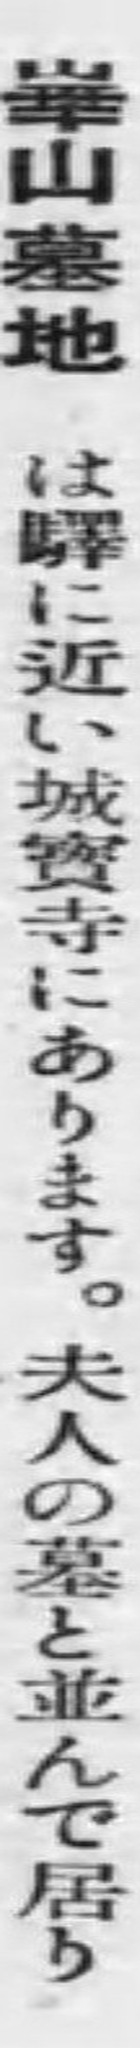崋山墓地は駅に近い城宝寺にあります。夫人の墓と並んで居り
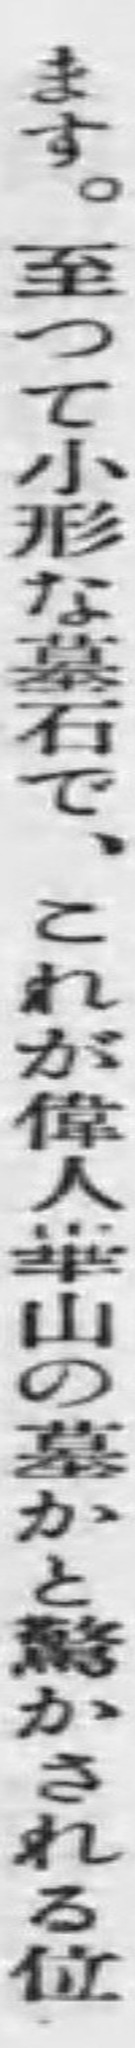ます。至つて小形な墓石で、これが偉人崋山の墓かと驚かされる位
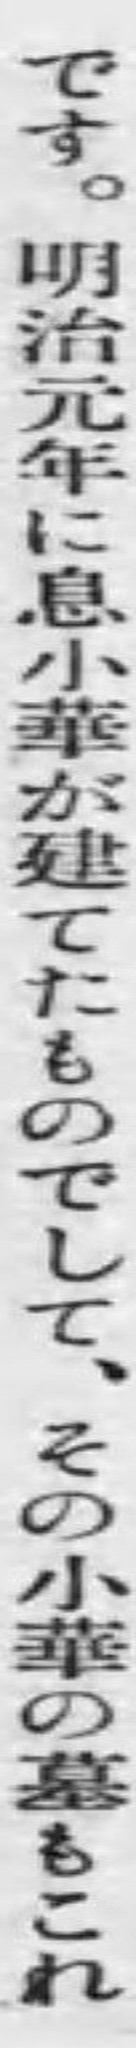です。明治元年に息小華が建てたものでして、その小華の墓もこれ
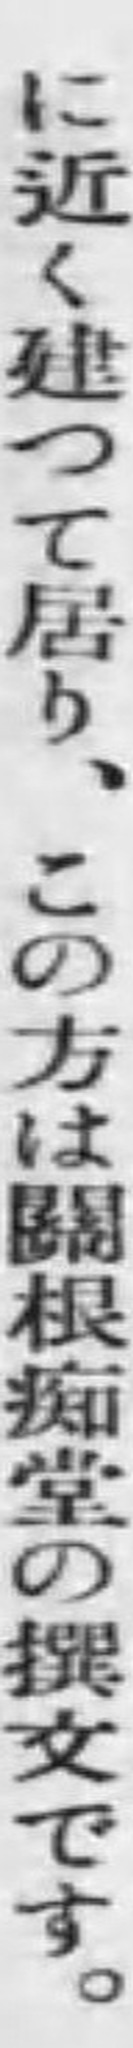に近く建つて居り、この方は関根痴堂の撰文です。
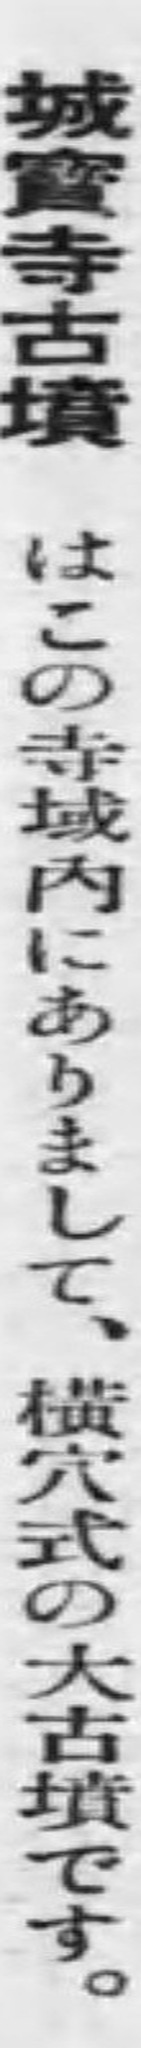城宝寺古墳はこの寺域内にありまして、横穴式の大古墳です。
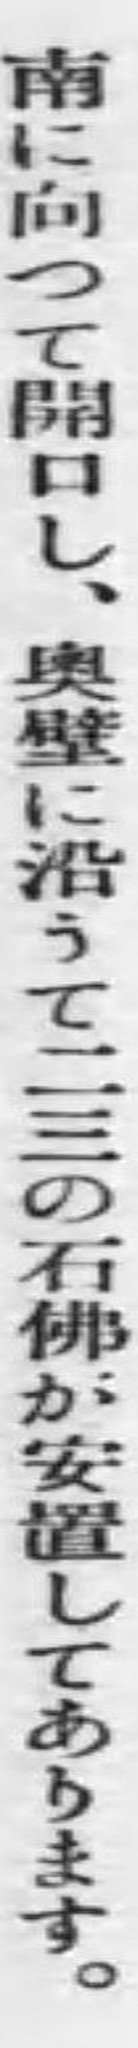南に向つて開口し、奥壁に沿うて二三の石仏が安置してあります。
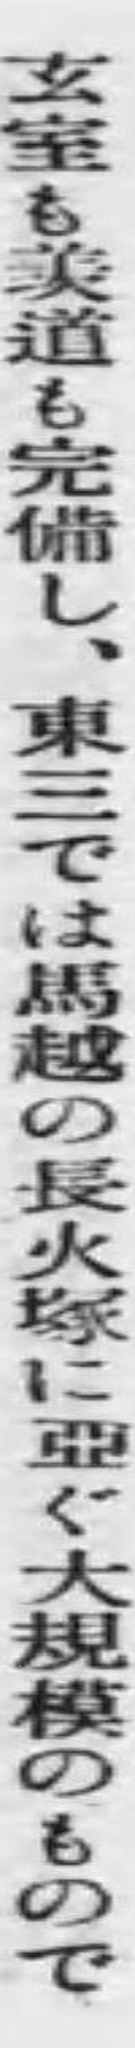玄室も羨道も完備し、東三では馬越の長火塚に亜ぐ大規模のもので
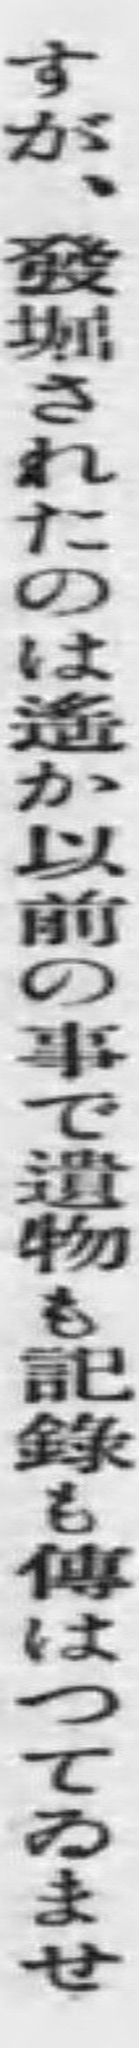すが、発堀されたのは遥か以前の事で遺物も記録も伝はつてゐませ
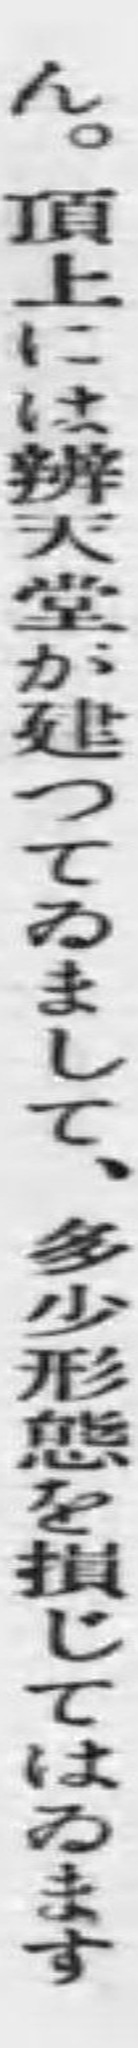ん。頂上には弁天堂が建つてゐまして、多少形態を損じてはゐます
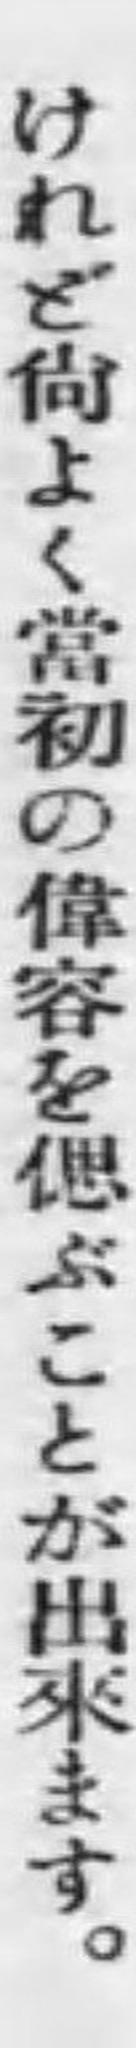けれど尚よく当初の偉容を偲ぶことが出来ます。
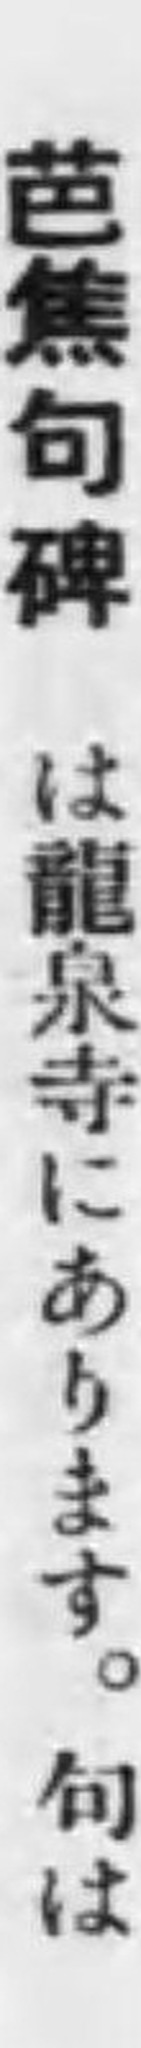芭蕉句碑は龍泉寺にあります。句は
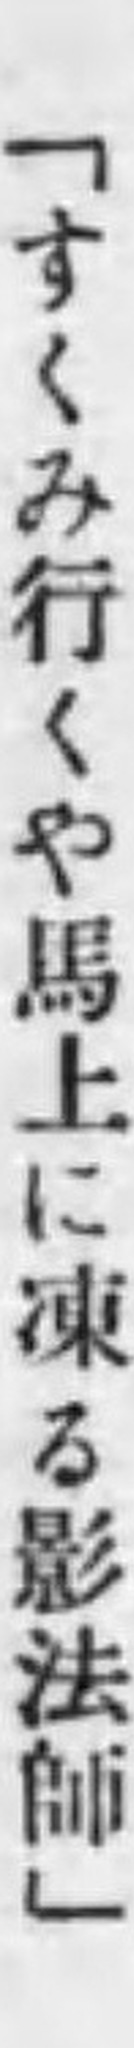「すくみ行くや馬上に凍る影法師」
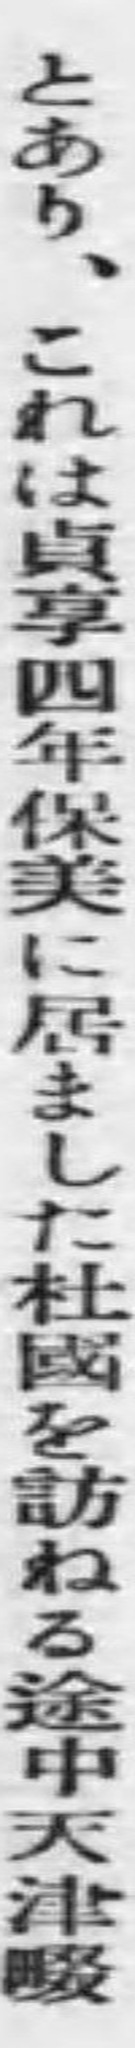とあり、これは貞享四年保美に居ました杜国を訪ねる途中天津畷
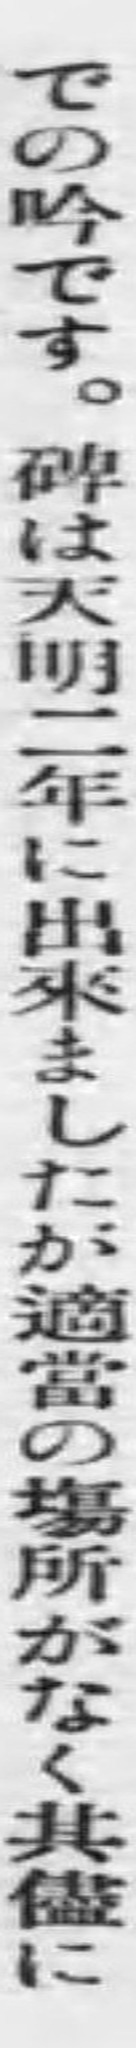での吟です。碑は天明二年に出来ましたが適当の場所がなく其侭に
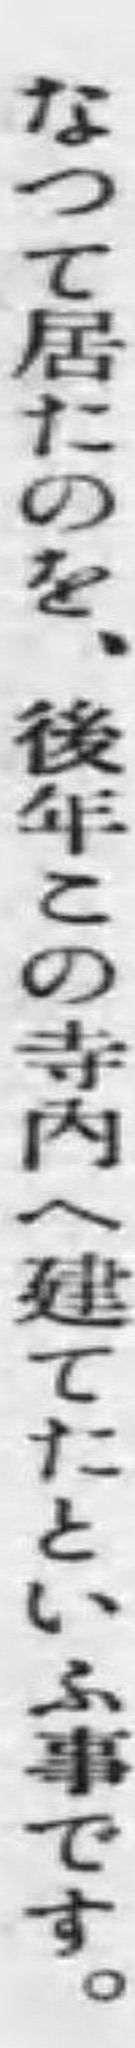なつて居たのを、後年この寺内へ建てたといふ事です。
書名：東三河道中記 : 豊橋市及其附近案内
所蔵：国立国会図書館 National Diet Library, JAPAN
